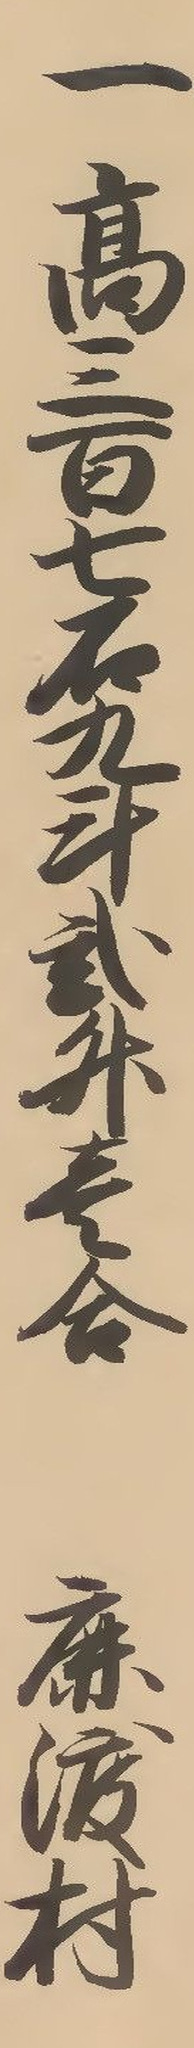一高三百七石九斗弐升壱合鹿渡村
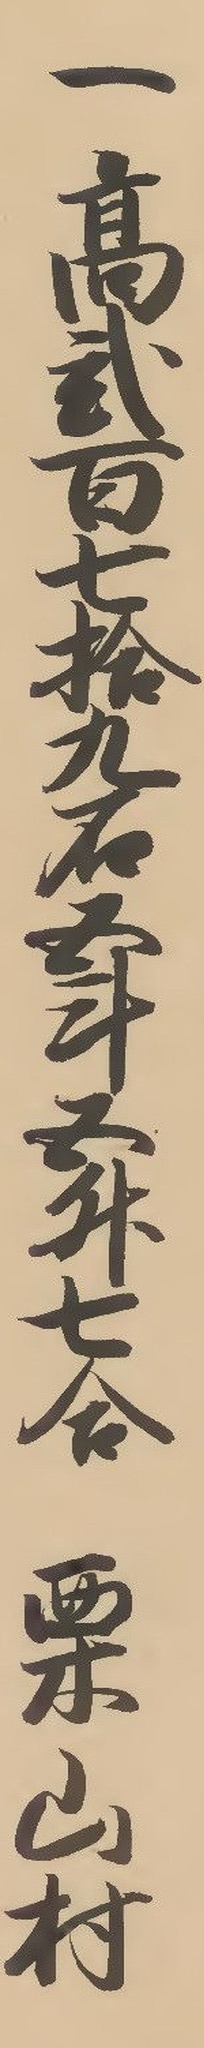一高弐百七拾九石五斗五升七合栗山村
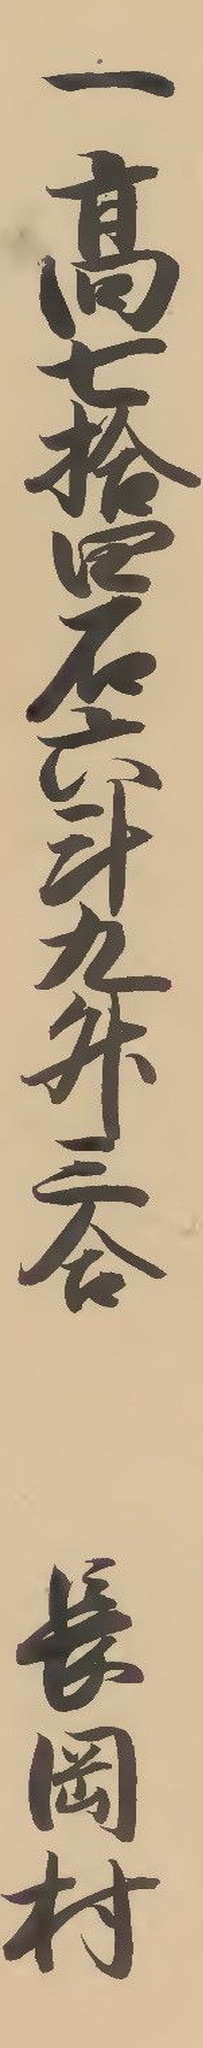一高七拾四石六斗九升三合長岡村

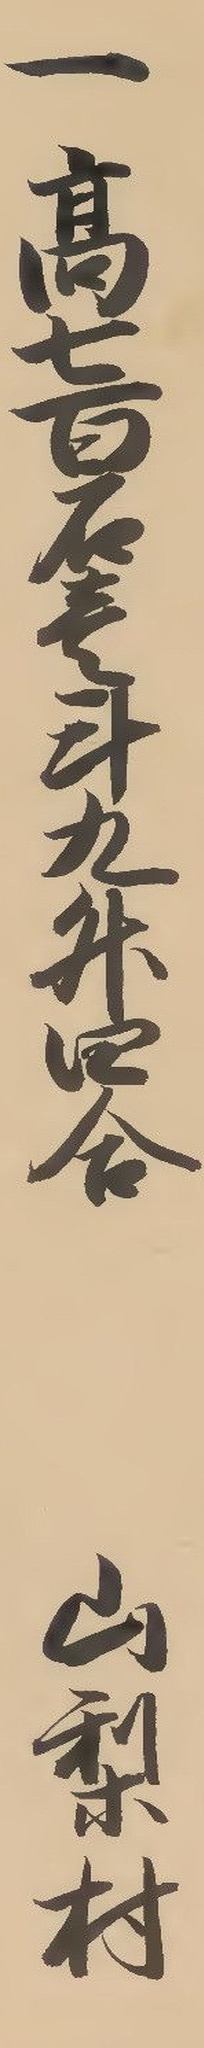一高七百石壱斗九升四合山梨村
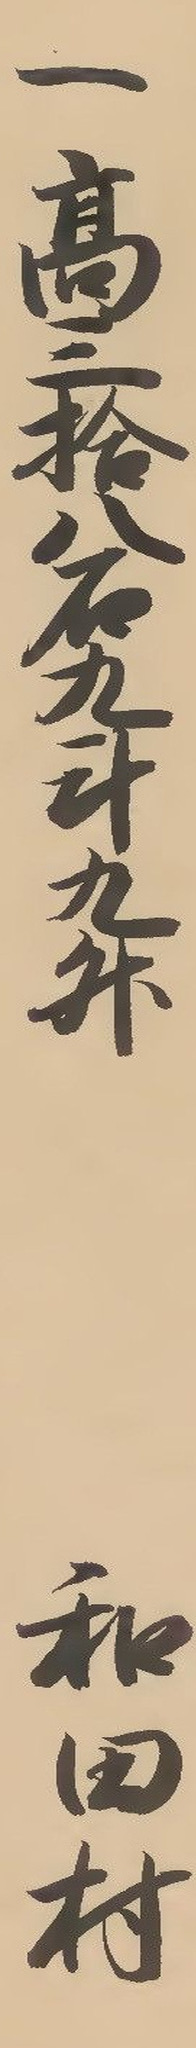一高三拾八石九斗九升和田村
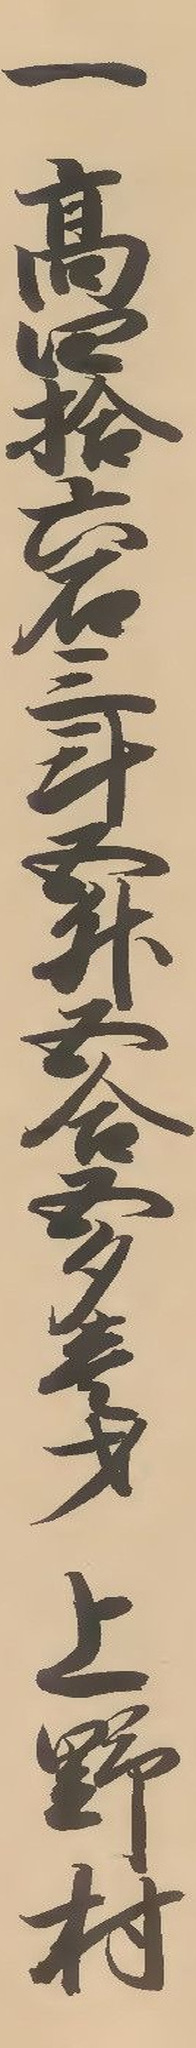一高四拾六石三斗五升五合五勺壱才上野村
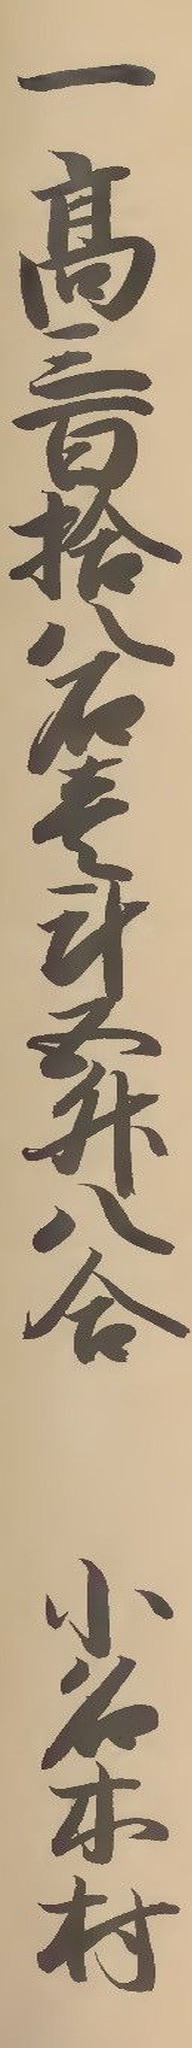一高三百拾八石壱斗五升八合小名木村
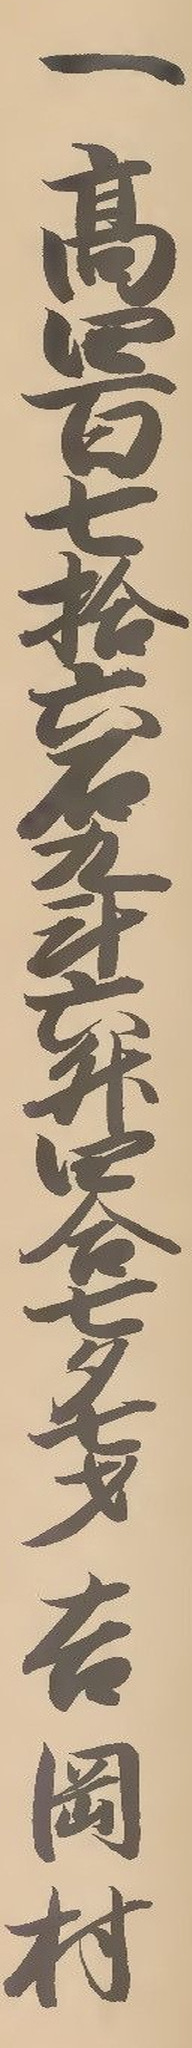一高四百七拾六石九斗六升四合七勺七才吉岡村
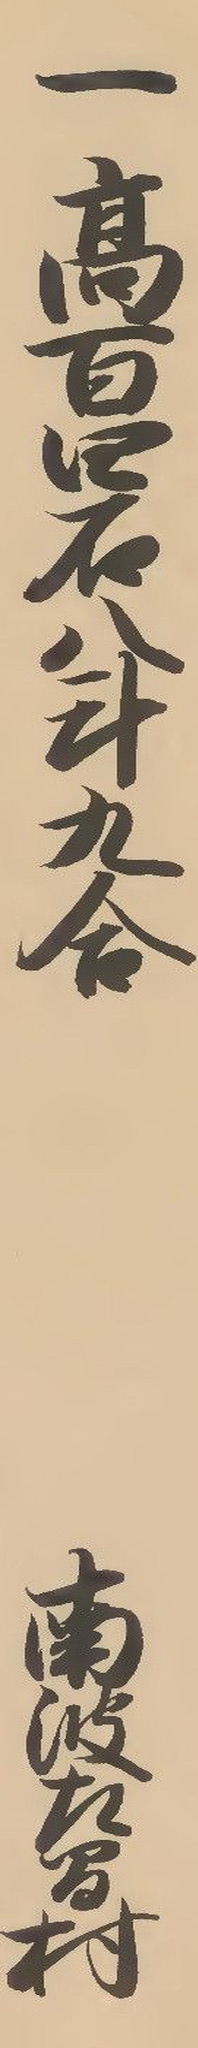一高百四石八斗九合南波左間村
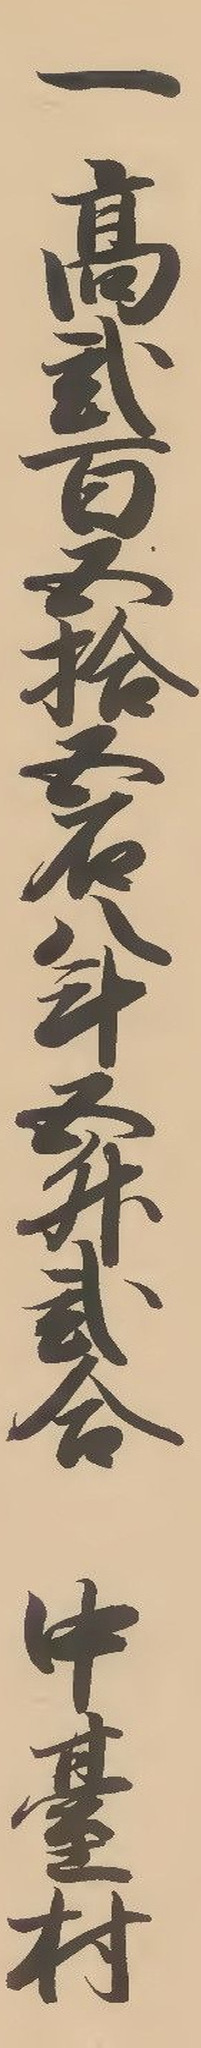一高弐百五拾五石八斗五升弐合中台村

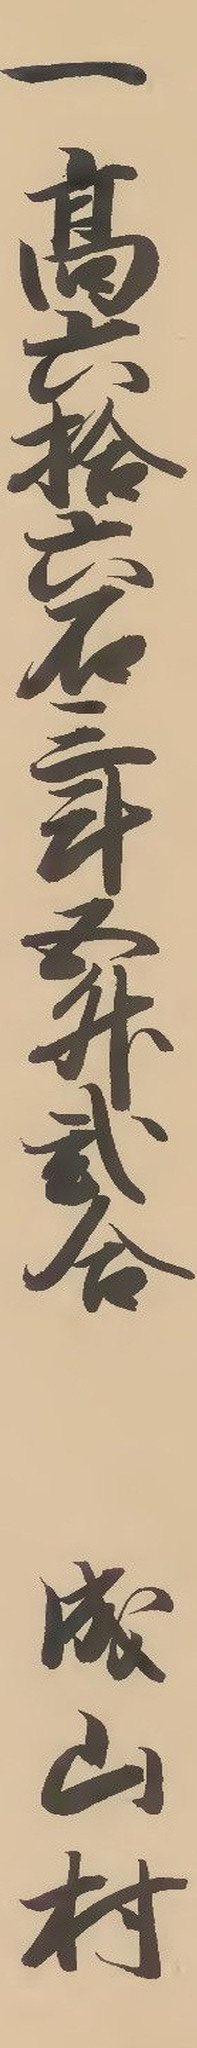一高六拾六石三斗五升弐合成山村
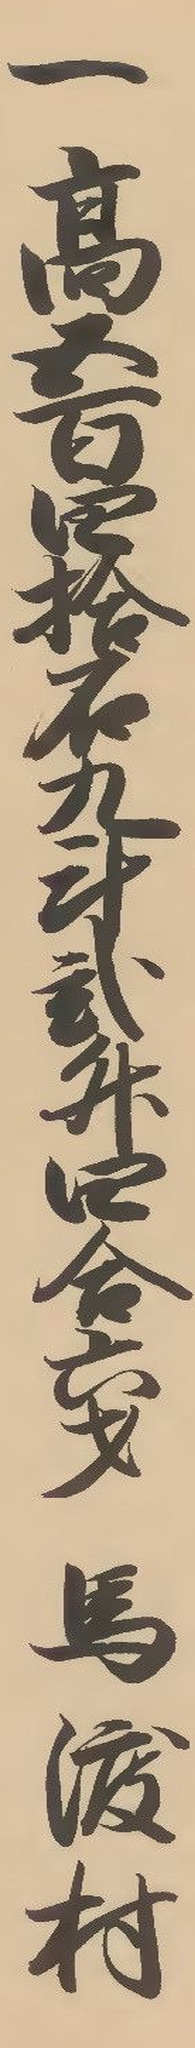一高五百四拾石九斗弐升四合六才馬渡村
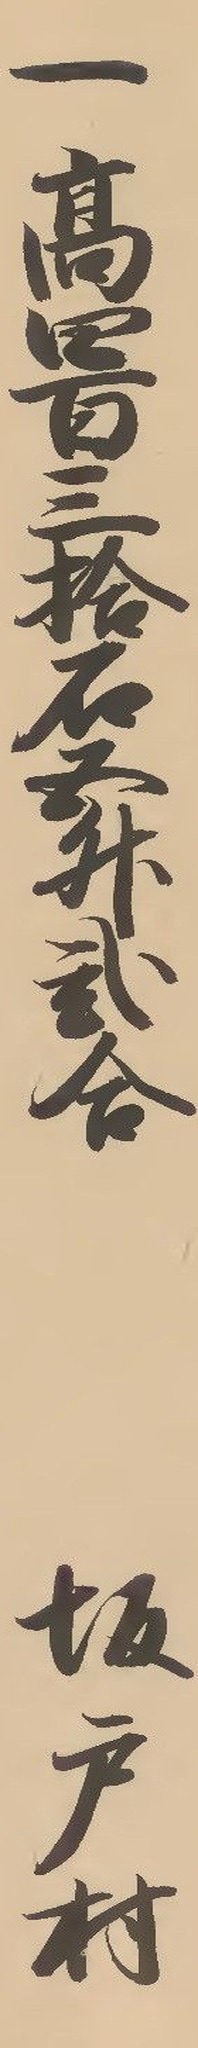一高四百三拾石五升弐合坂戸村
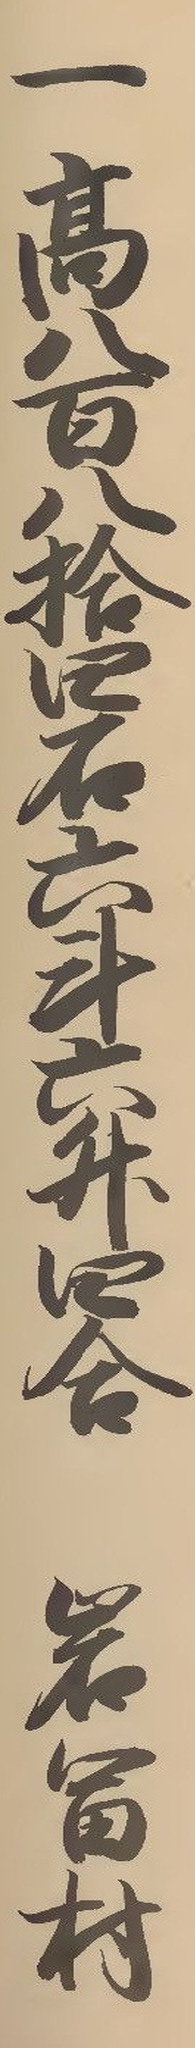一高八百八拾四石六斗六升四合岩富村
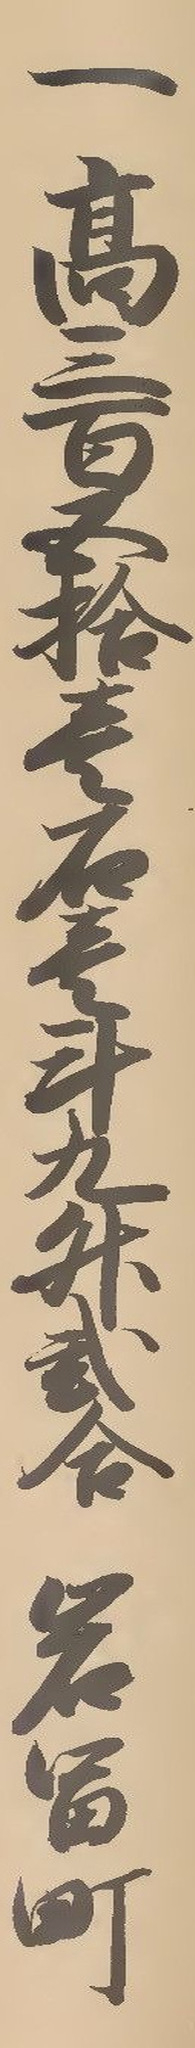一高三百五拾壱石壱斗九升弐合岩富町
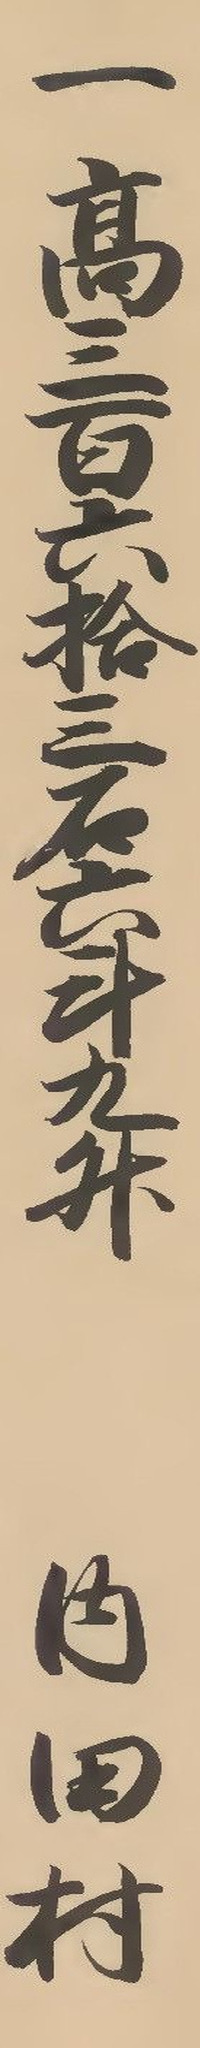一高三百六拾三石六斗九升内田村
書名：下総国郷帳
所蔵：国立公文書館 National Archives of Japan
